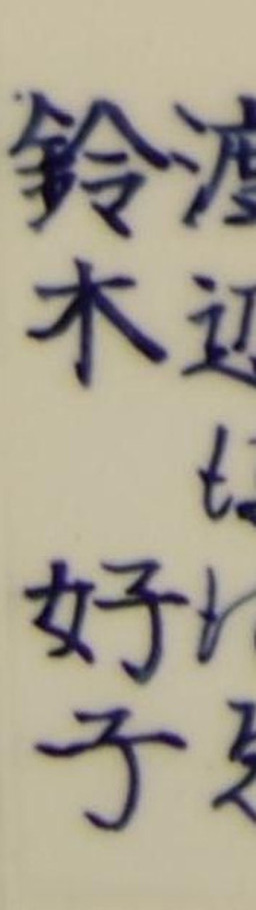鈴木好子

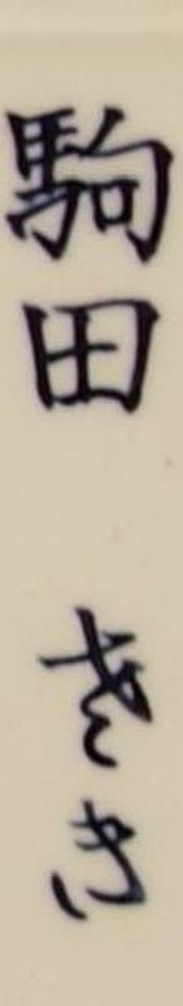駒田さき
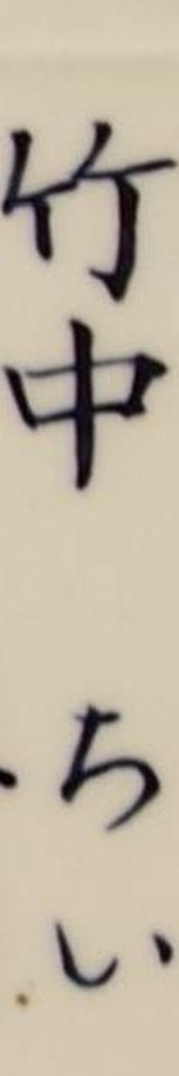竹中ちい
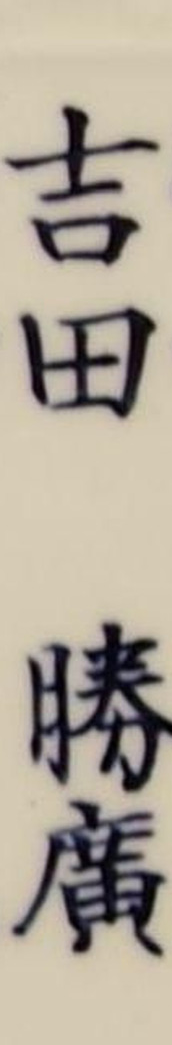吉田勝広
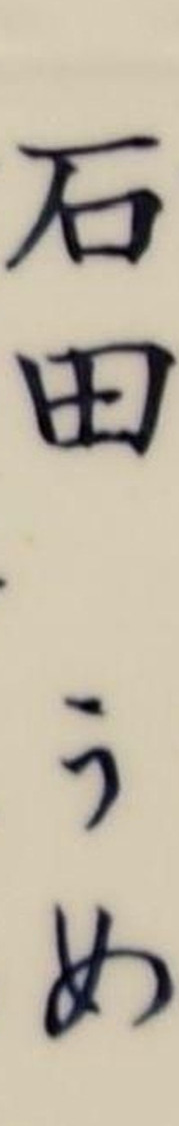石田うめ
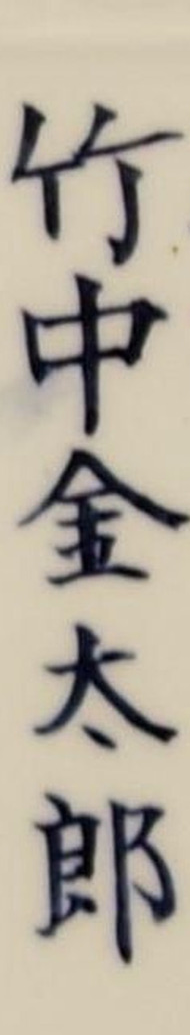竹中金太郎
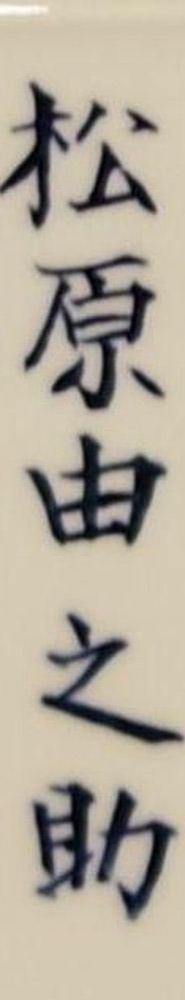松原由之助
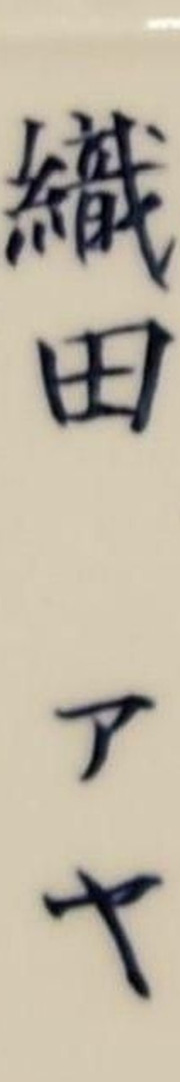織田アヤ
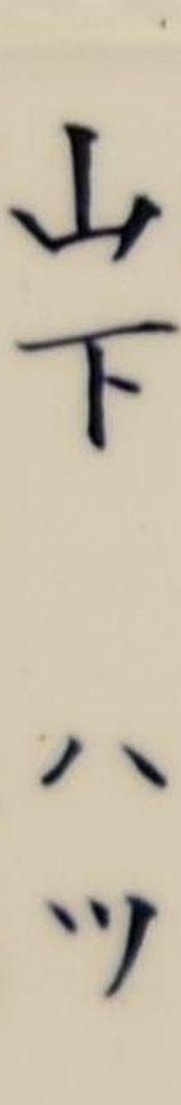山下ハツ
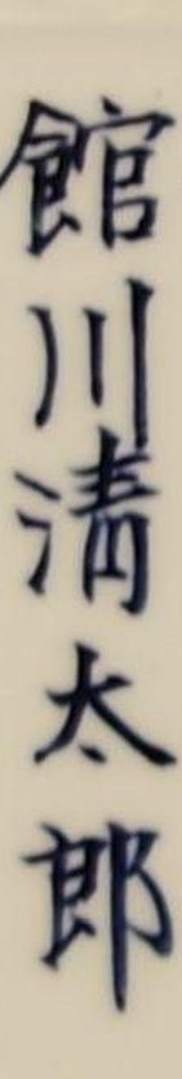館川清太郎
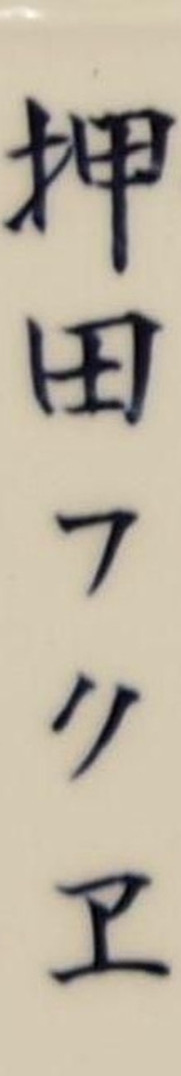押田フクヱ
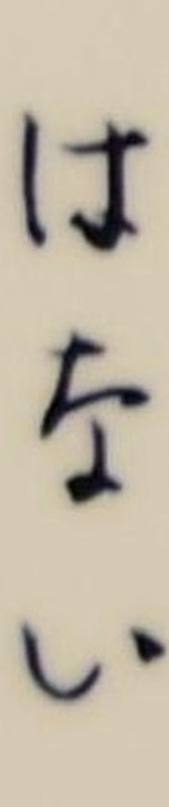はない
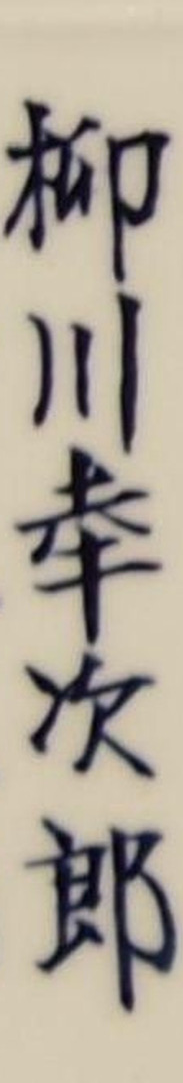柳川幸次郎
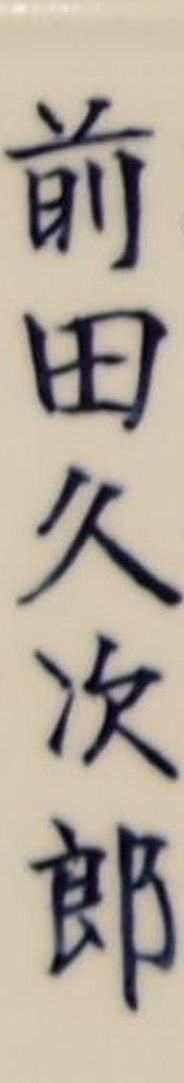前田久次郎
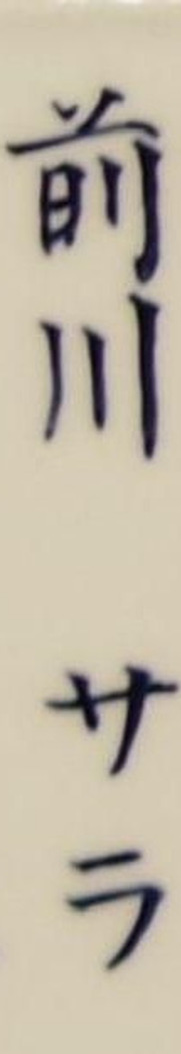前川サラ
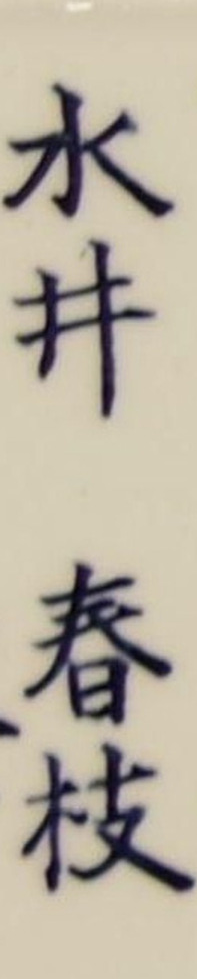水井春枝
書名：A~D
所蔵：koyasan kongobuji
